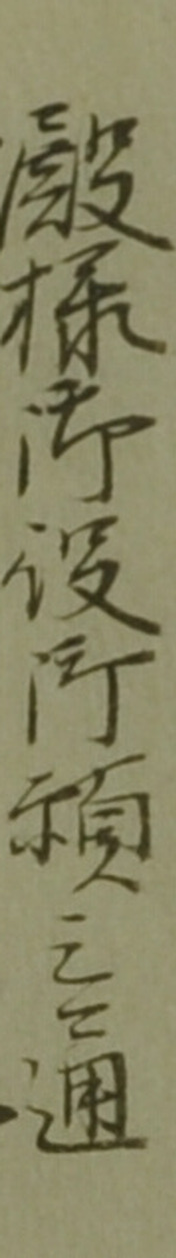殿様御役所願之通
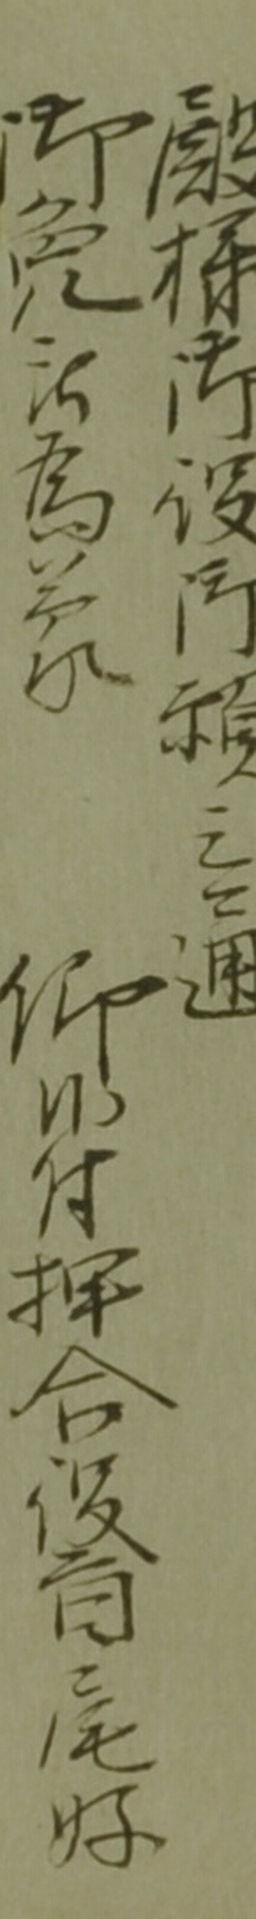御免被為蒙仰候付押合役首尾好
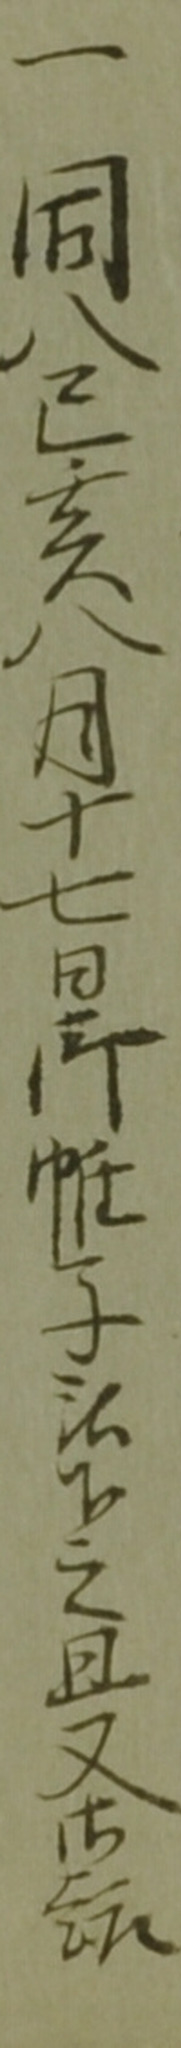一同八己亥八月十七日御帷子被下之且又御趣
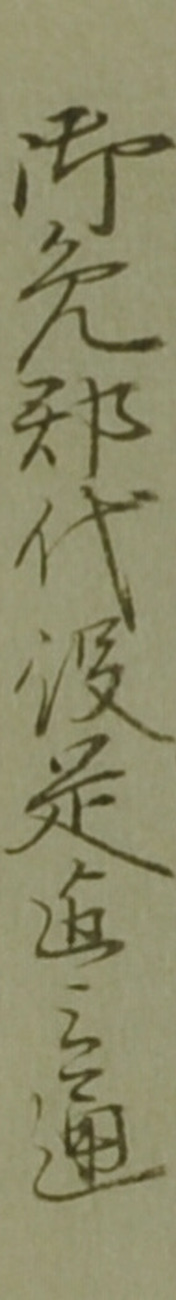御免郡代役是迄之通
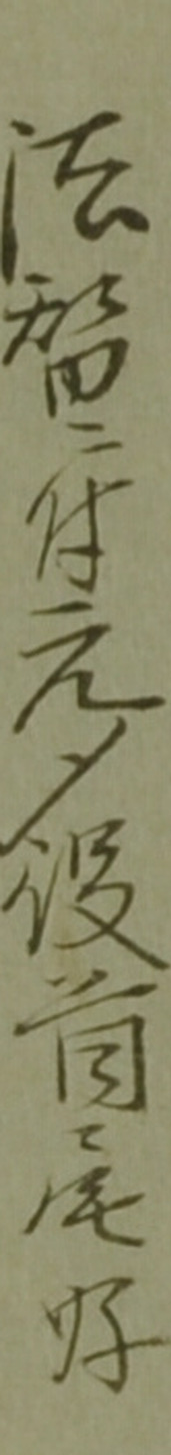法替付元〆役首尾好
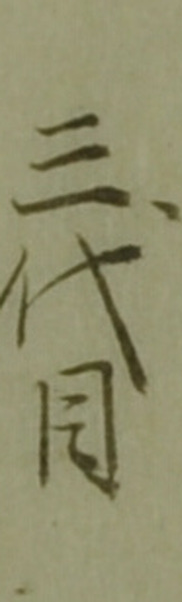三代目
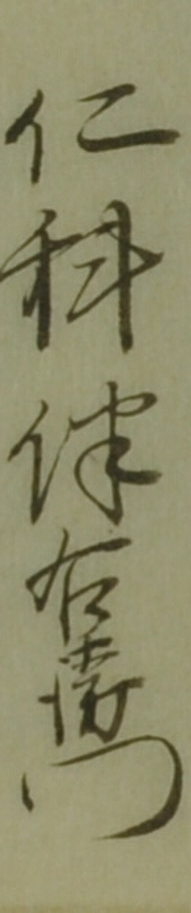仁科伴右衛門
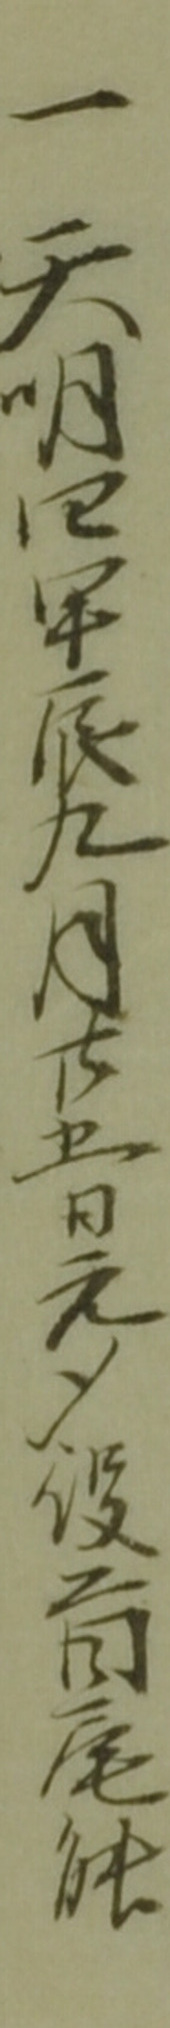一天明四甲辰九月廿五日元〆役首尾能
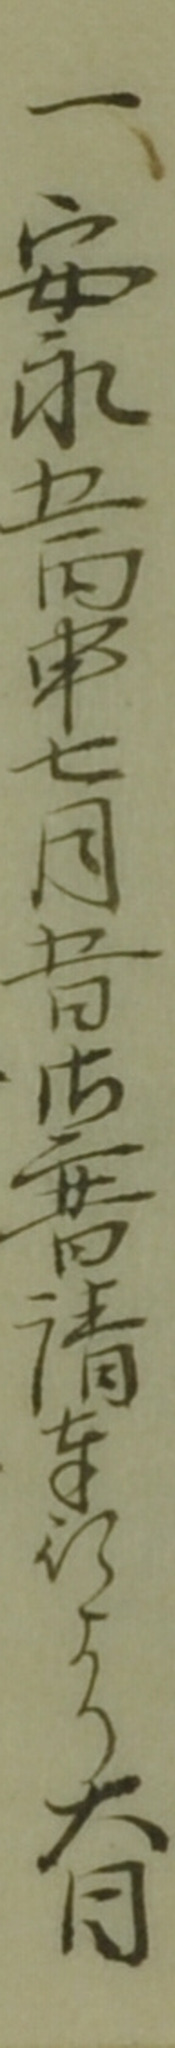一安永五丙申七月五日御普請奉行より大目
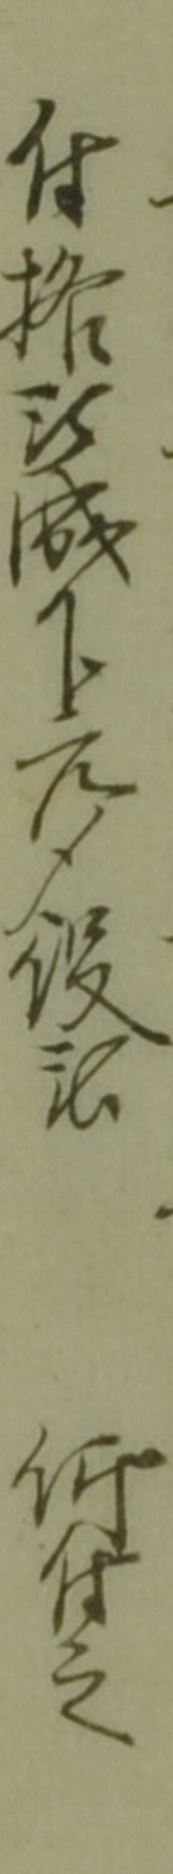付格被成下元〆役被仰付之
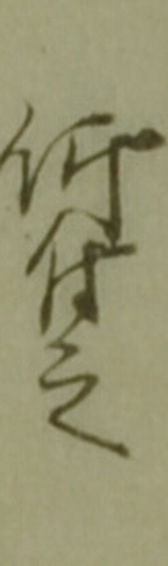仰付之
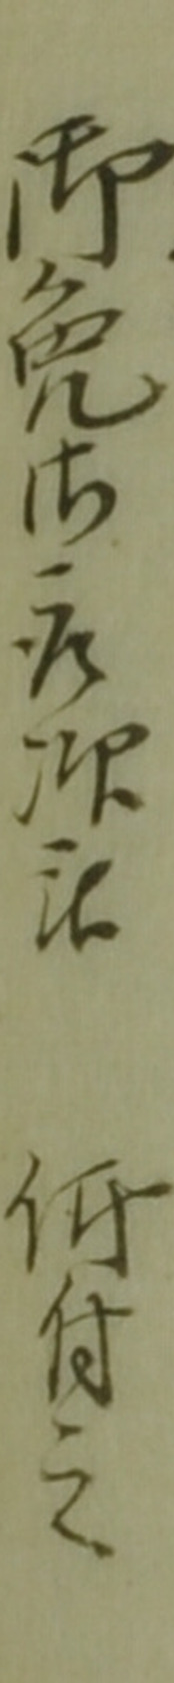御免御取次被仰付之
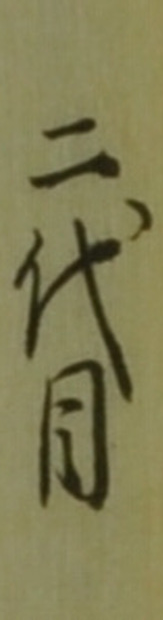二代目
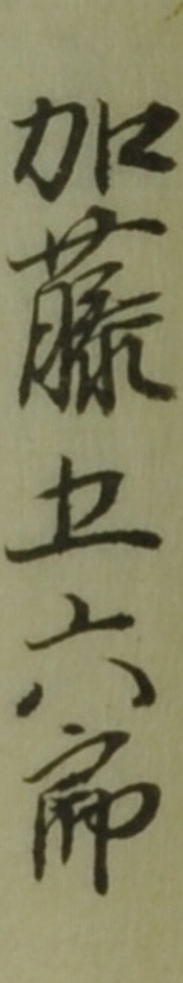加藤五六郎
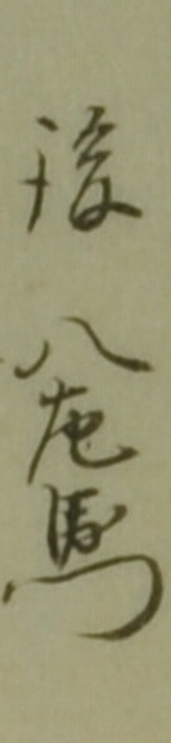後八左衛門
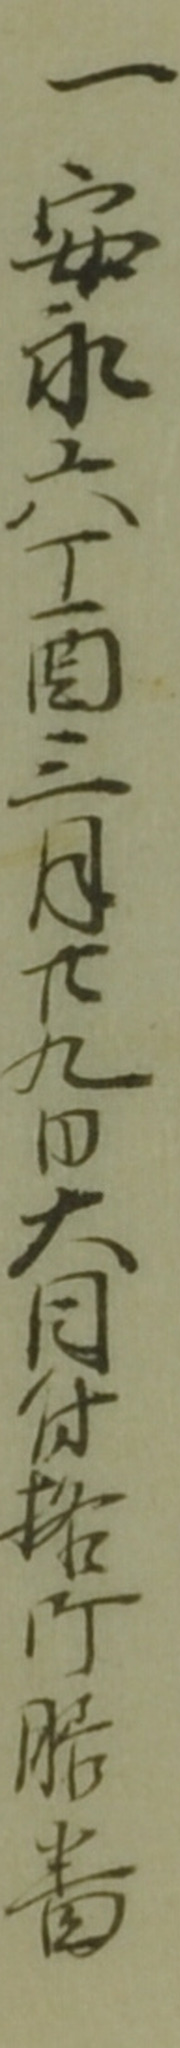一安永六丁酉三月廿九日大目付格御膳番
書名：諸御役代々録（七）
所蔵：伊那市立高遠町図書館・合同会社AMANE
